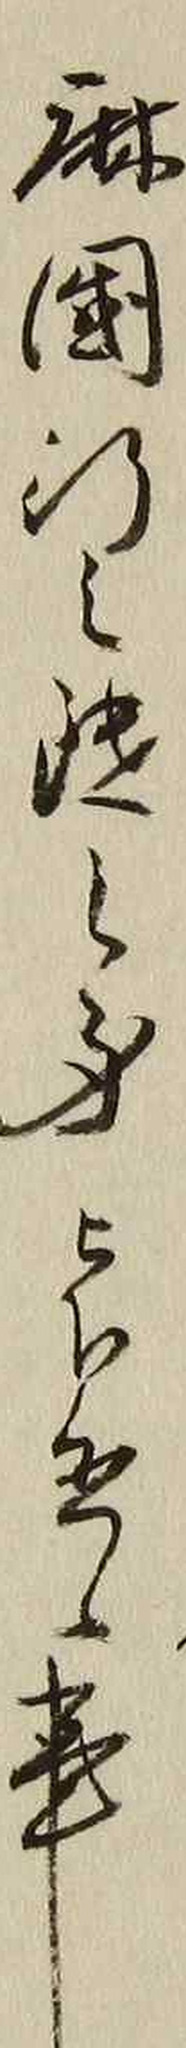麻国行之鎗之身被下置候事
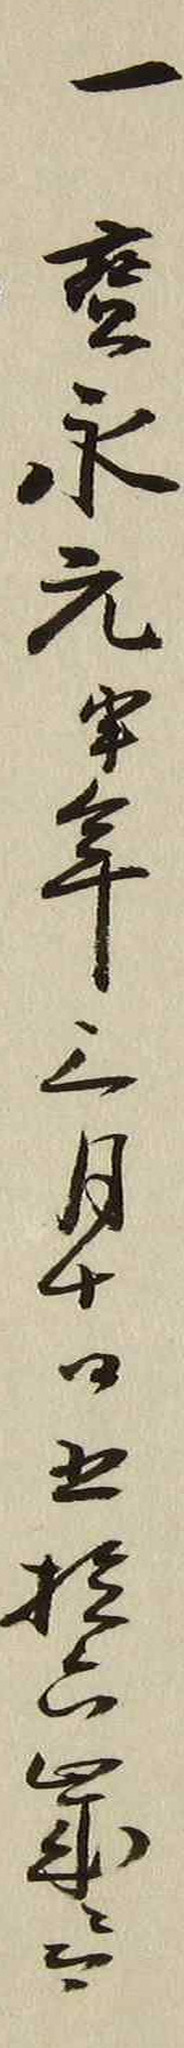一宝永元申年三月十日五拾六歳に而
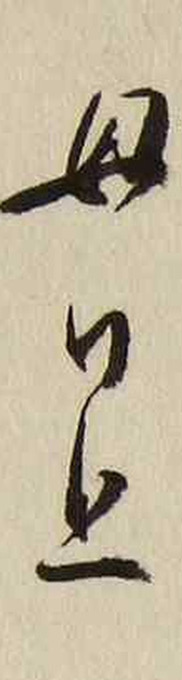母同上

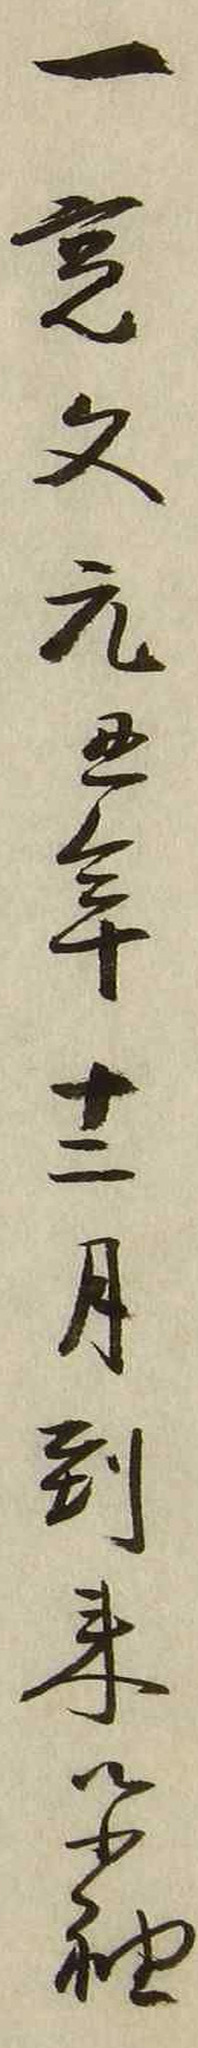一寛文元丑年十二月到来御小袖
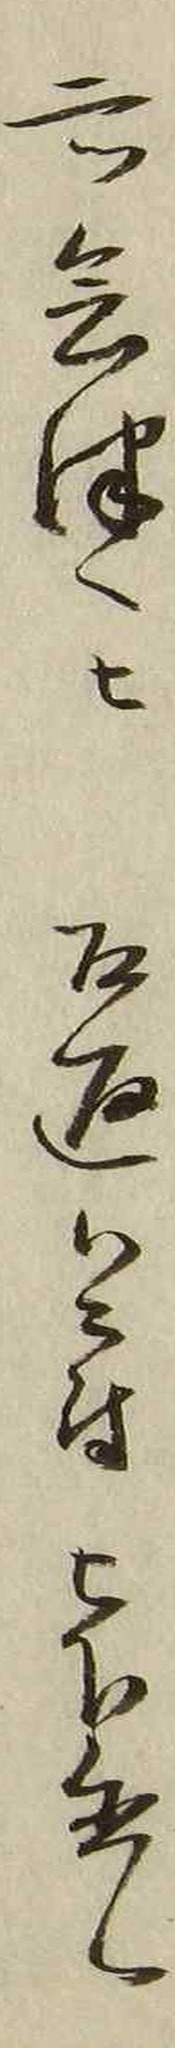二つ会津へ被召返候に付被下置候
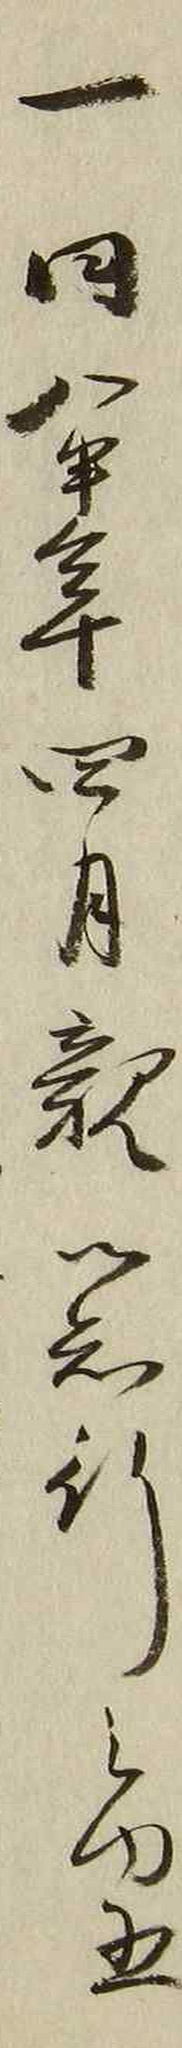一同八申年四月親御知行之内五
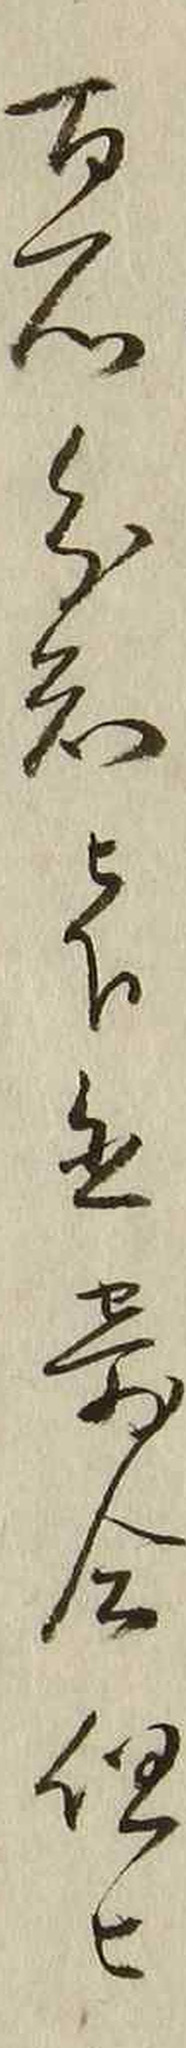百石分知被下置寄合組被
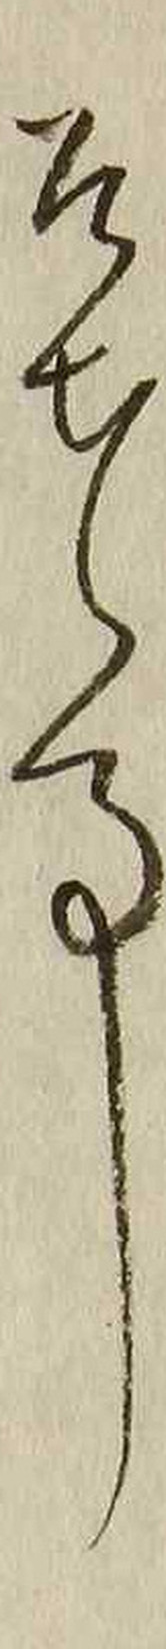召出候事
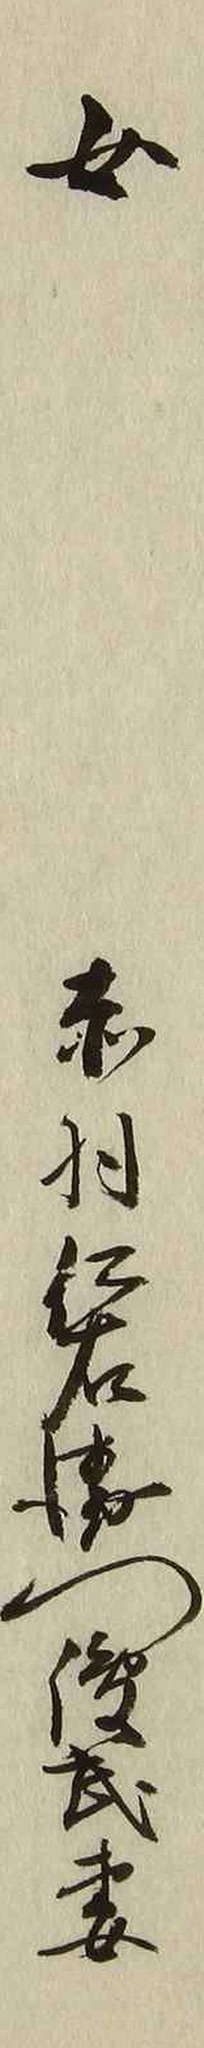女赤羽仁右衛門俊武妻
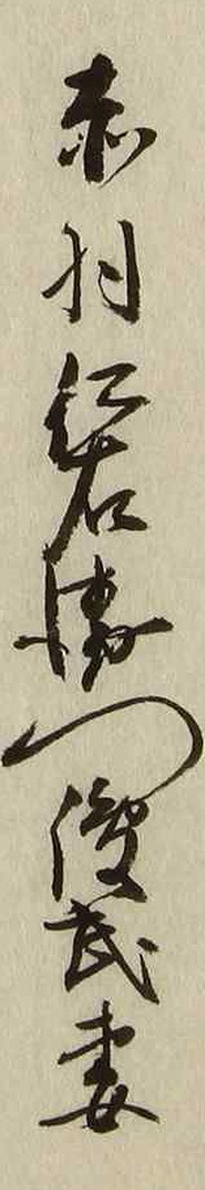女赤羽仁右衛門俊武妻
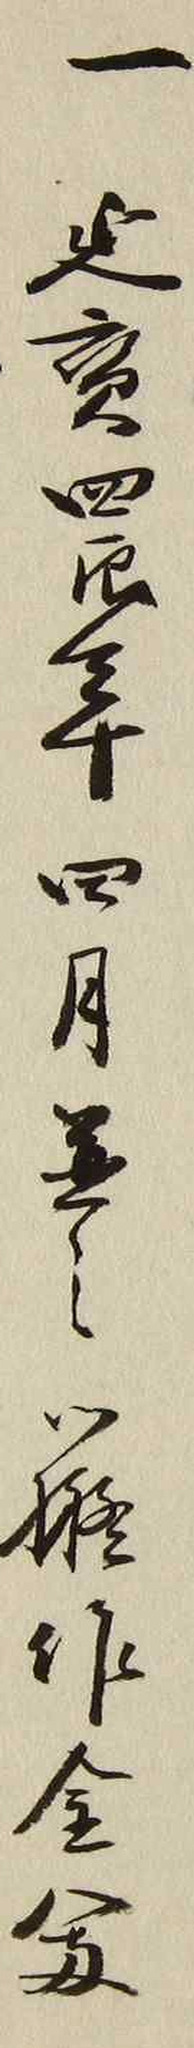一延宝四辰年四月並之御擬作金八両
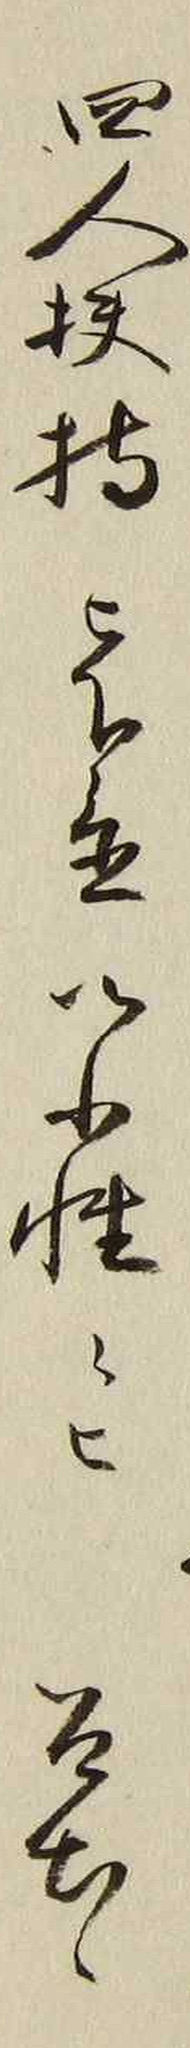四人扶持被下置御小姓に被召出候
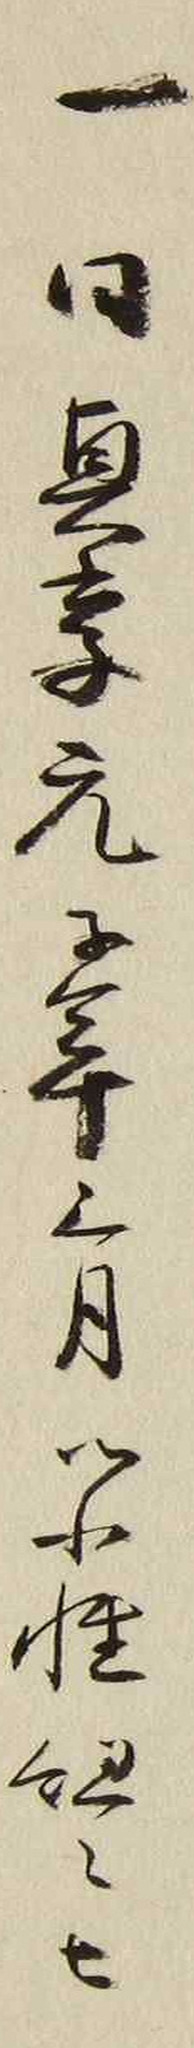一同貞享元子年三月御小姓組に被
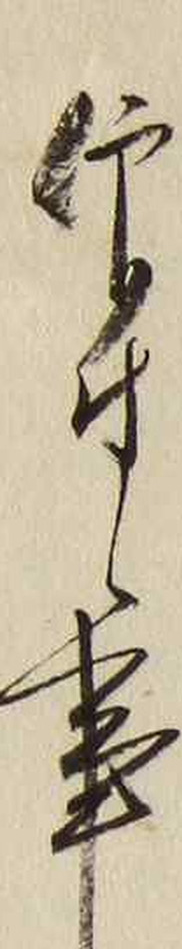仰付候事

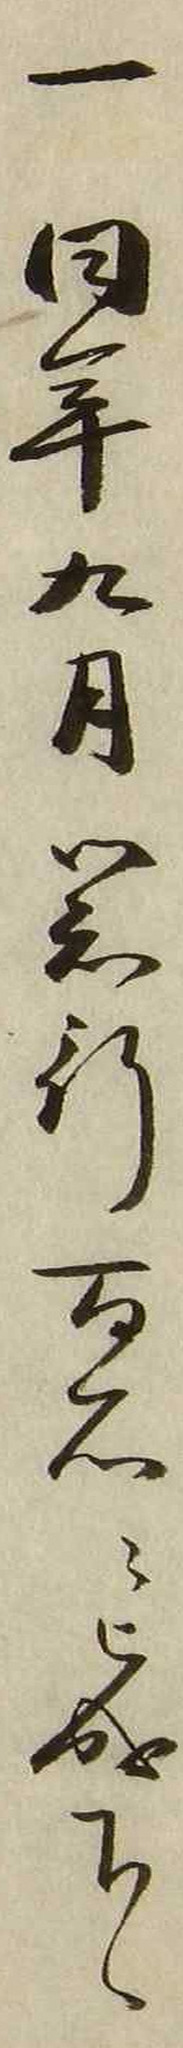一同年九月御知行百石に被成下候
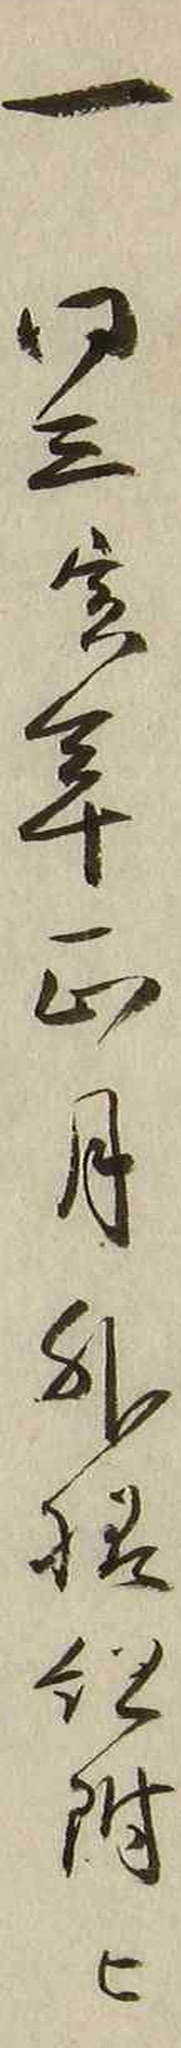一同三寅年正月外様組附被
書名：諸士系譜　巻之292　き之部1
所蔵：会津若松市立会津図書館
